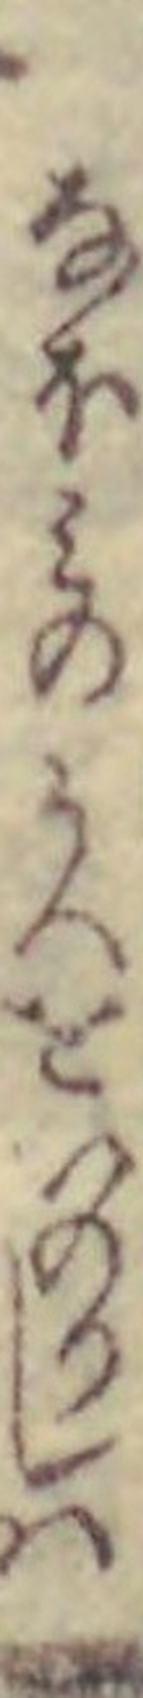なほみのうへをいのりしは
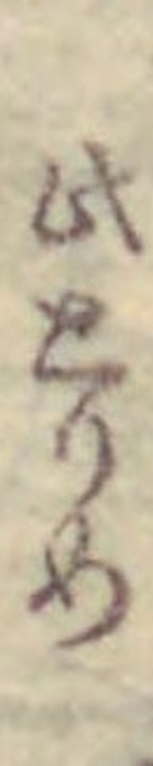此とりめ
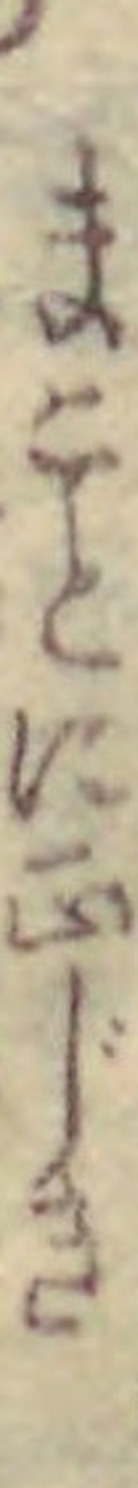まことに正じき
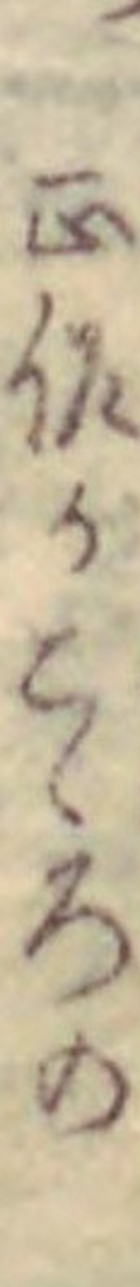正作がこゝろの
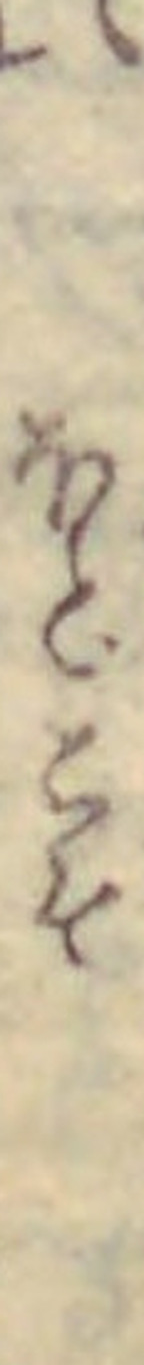ほどこそ
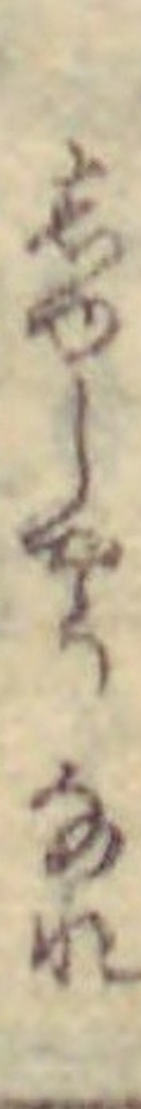しゆしやうなれ
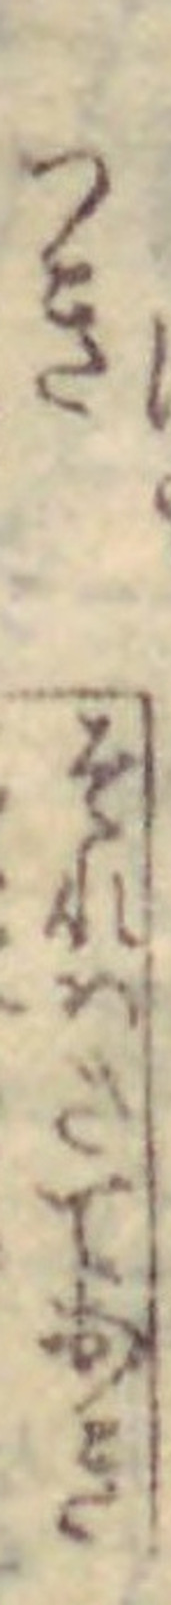「それはさておき
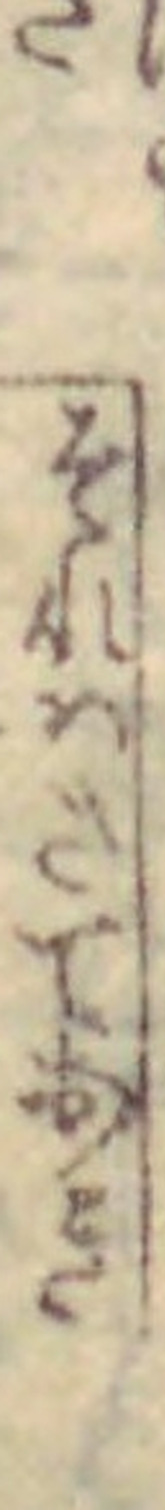「それはさておき
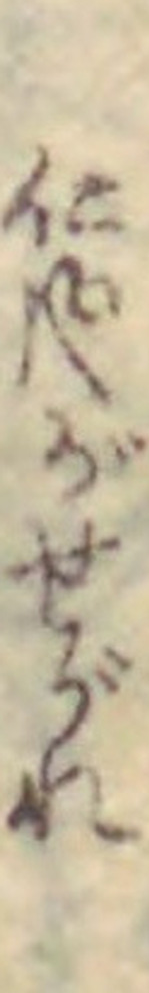仁内がせがれ
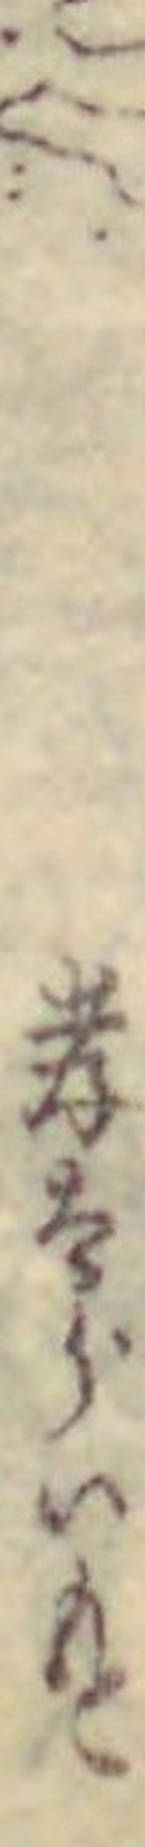孝太郎いもと
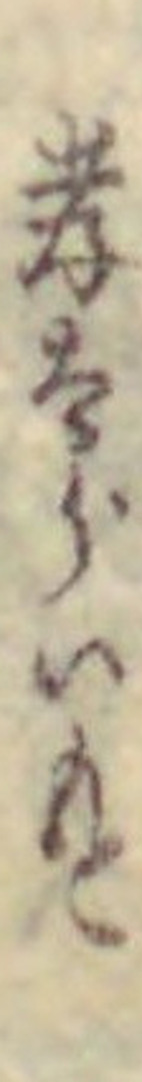孝太郎いもと
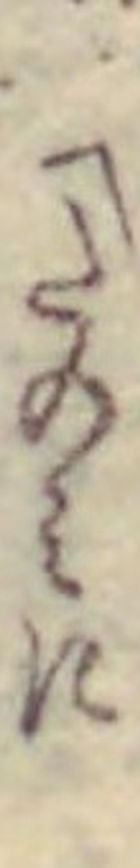〽たのみに
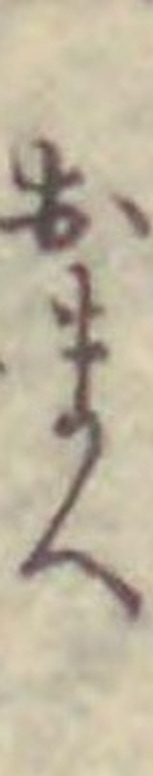おまへ
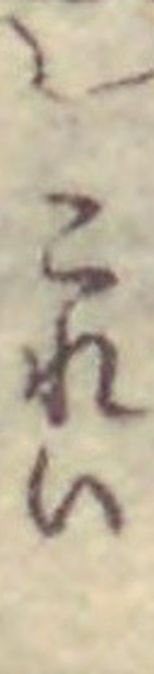これは
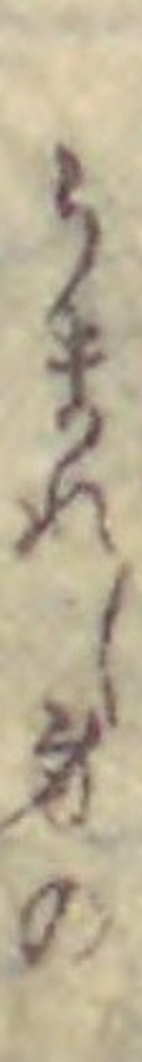うまれし身の
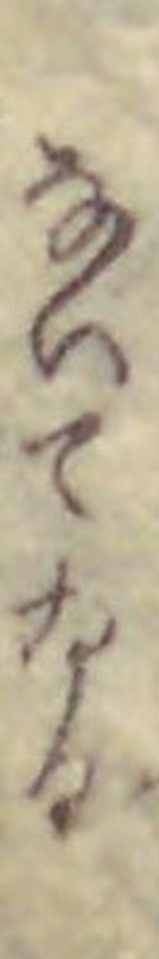ないてゐる
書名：八ツ目鱣因縁物語 3巻
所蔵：国立国会図書館 National Diet Library, JAPAN
